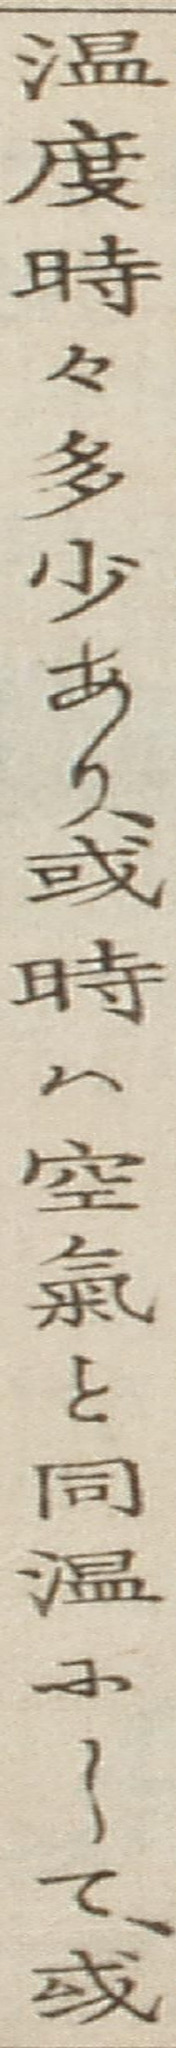温度時々多少あり、或時は空気と同温にして、或
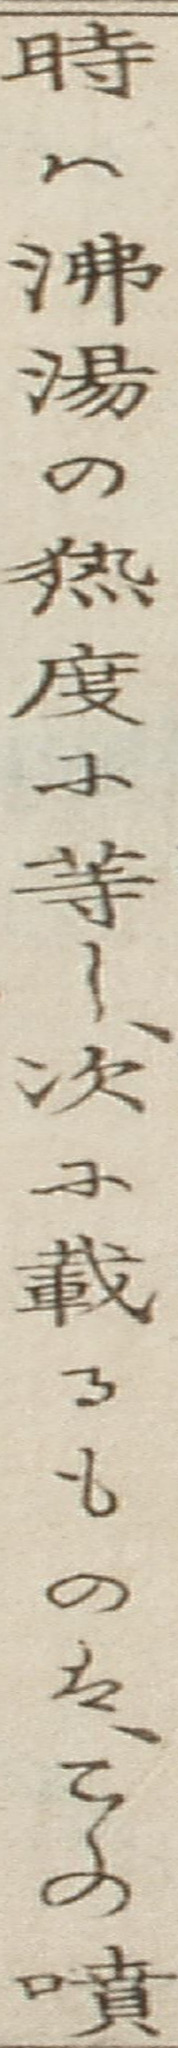時は沸湯の熱度に等し、次に載るものは、この噴
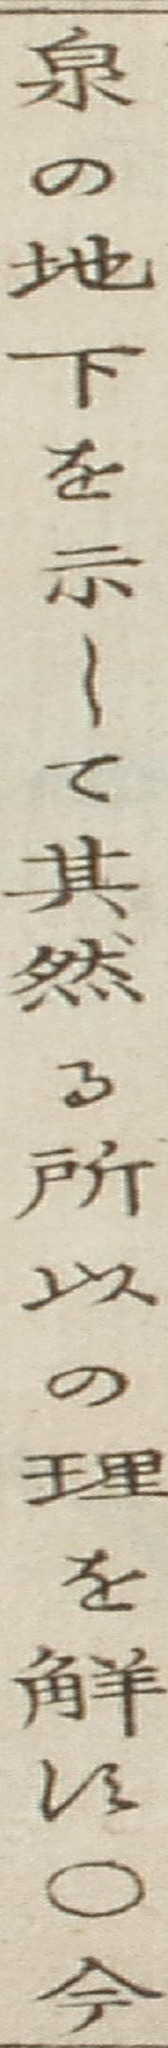泉の地下を示して其然る所以の理を解す〇今
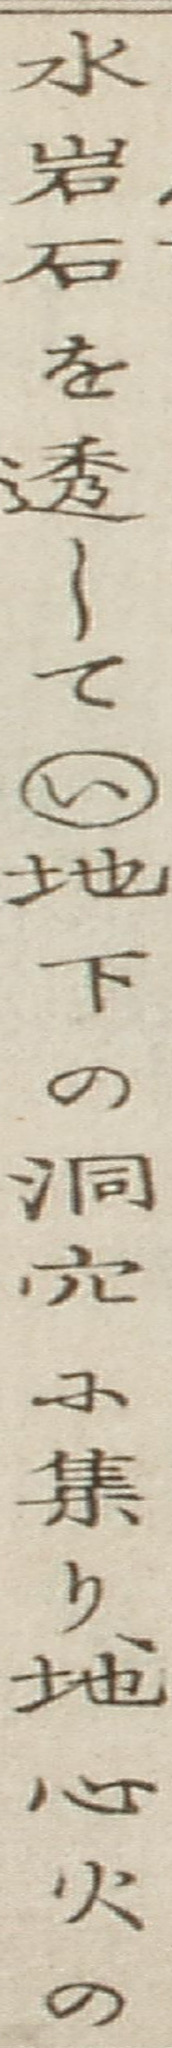水岩石を透して地下の洞穴に集り、地心火の
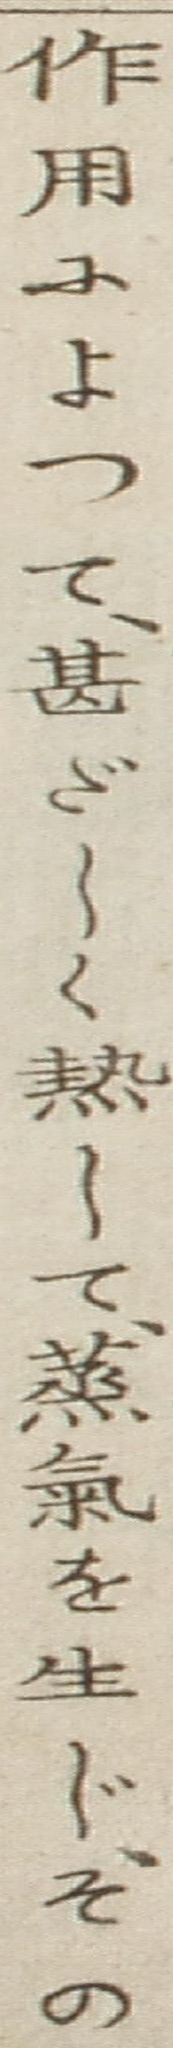作用によつて、甚だしく熱して、蒸気を生じ、その
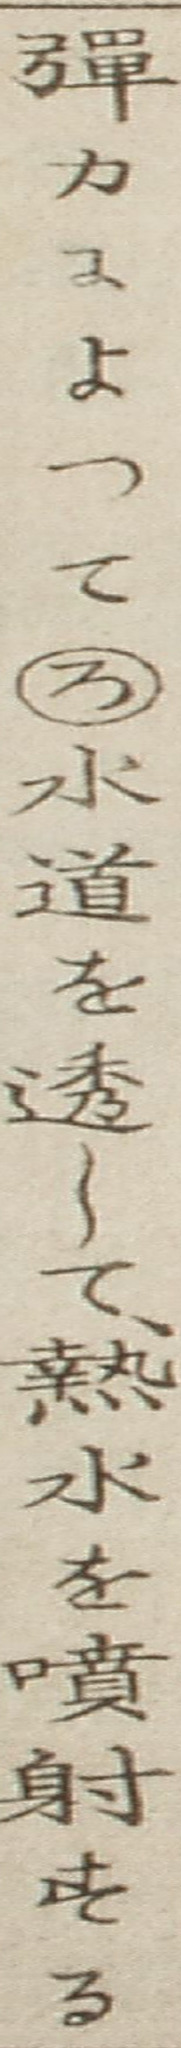弾力によつて水道を透して、熱水を噴射する

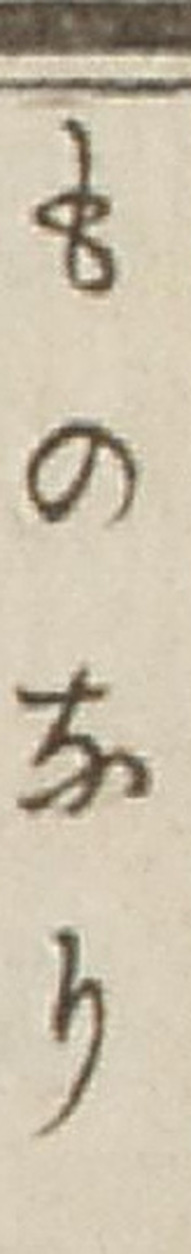ものなり
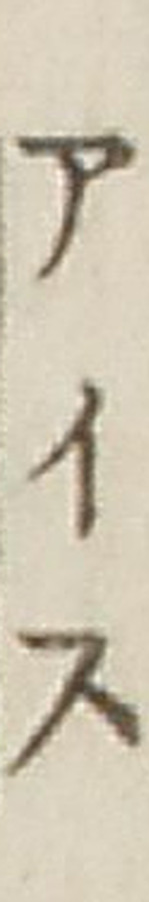アイス
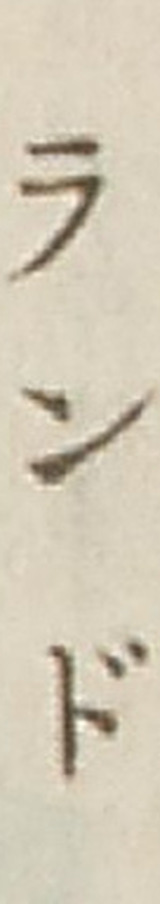ランド

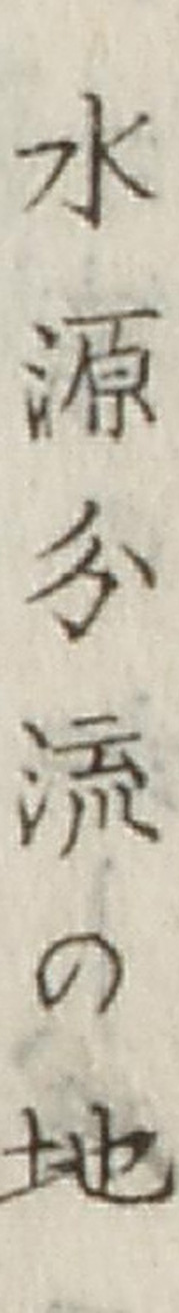水源分流の地
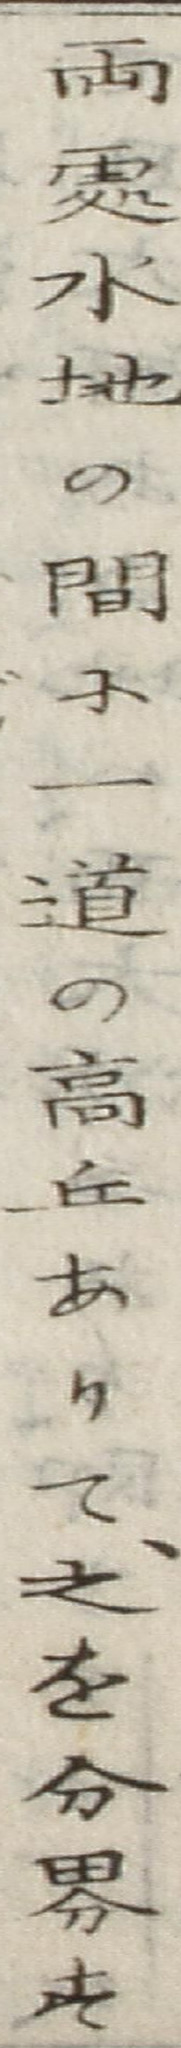両処水地の間に一道の高丘ありて、之を分界す
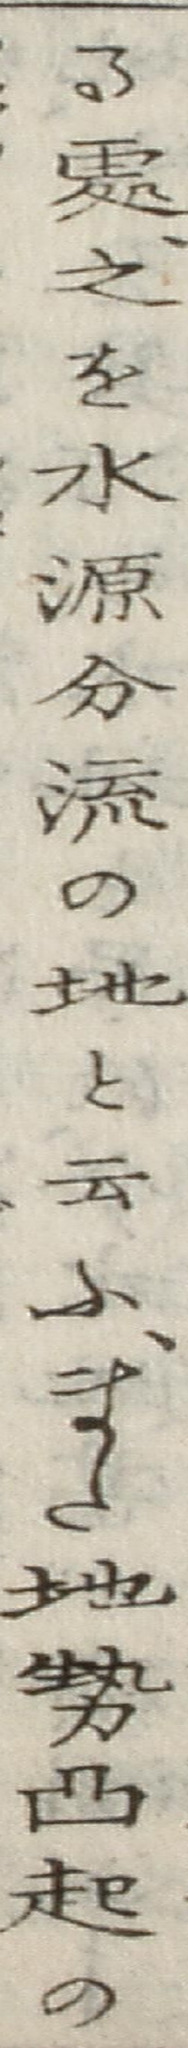る処、之を水源分流の地と云ふ、また地勢凸起の
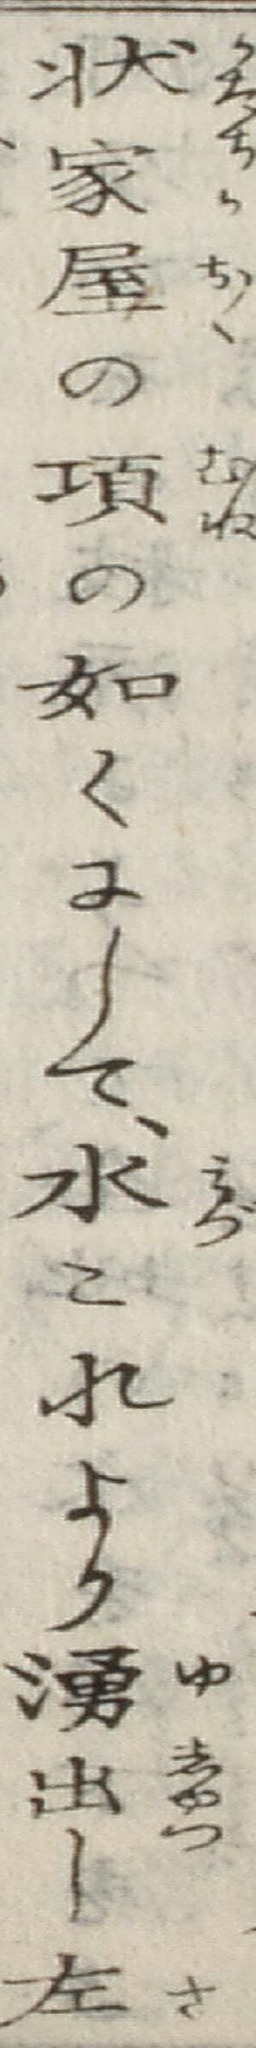状家屋の項の如くにして、水これより湧出し左
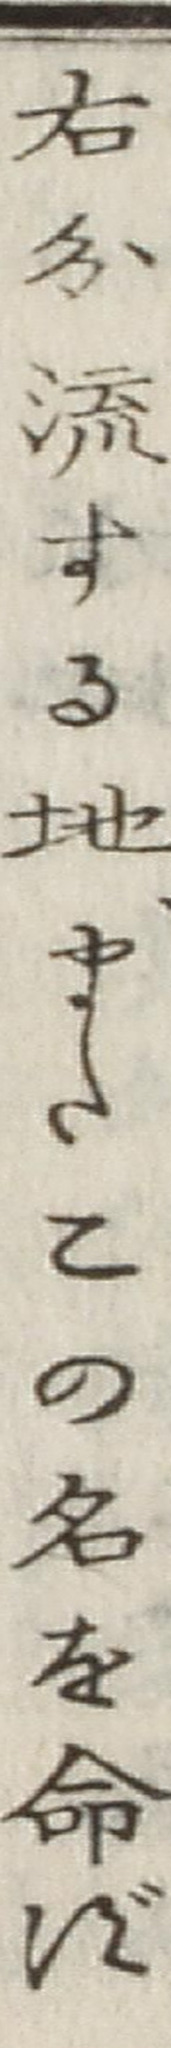右分流する地、またこの名を命ず
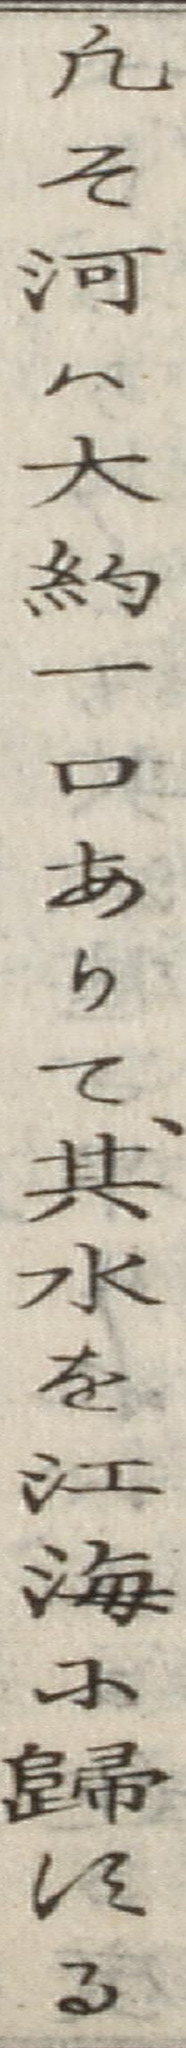凡そ河は大約一口ありて、其水を江海に帰する
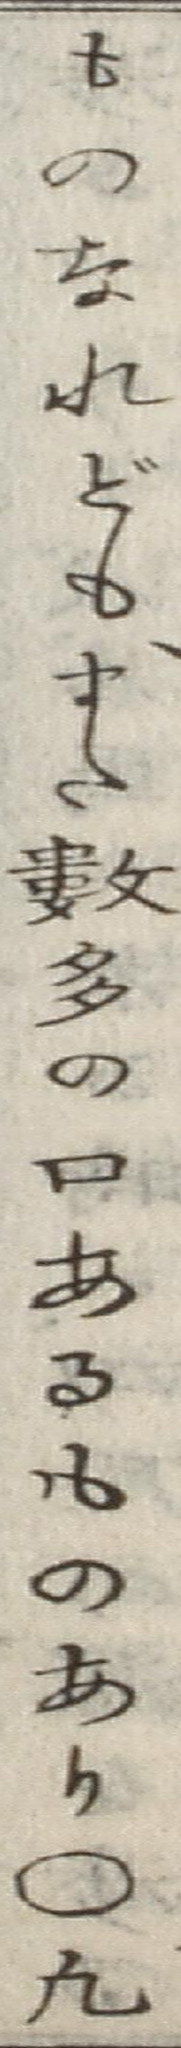ものなれども、また数多の口あるものあり○凡
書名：訓蒙　天然地理學　中
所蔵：東京大学地震研究所図書室 Earthquake Research Institute Library, The University of Tokyo, JAPAN
